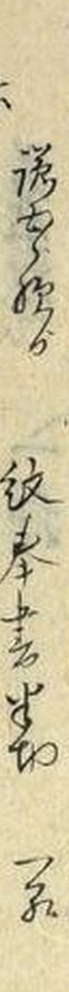謙五郎様ゟ紋奉書半切一箱
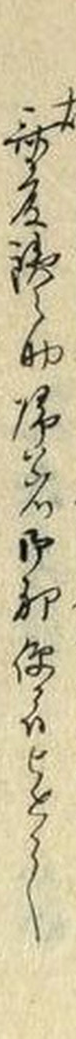右此度鉄之助帰着御初便ニ付被進之
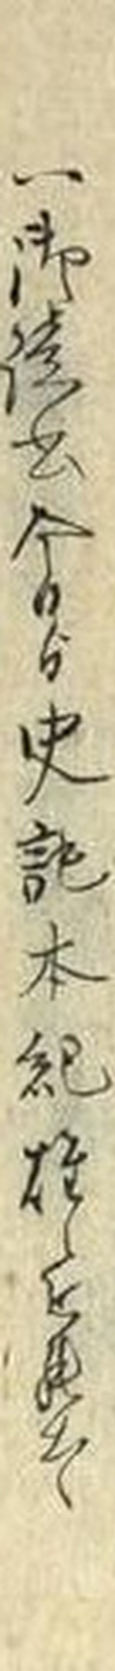一御読書今日ゟ史記本紀雄之進罷出候
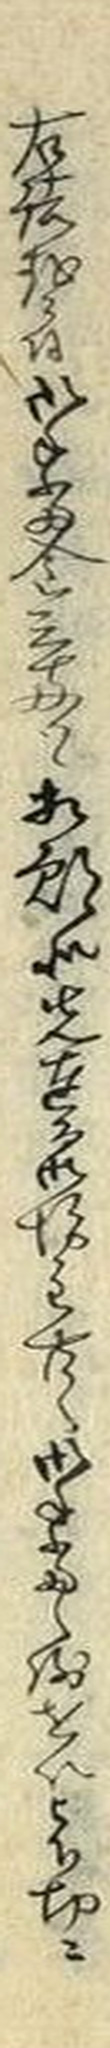右詰越ニ付御手当金三両ツゝ相願候処先達而御坊主共へ御手当之例を以被下切ニ
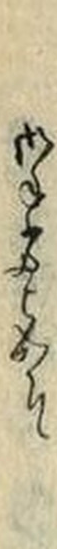御手当被成下候

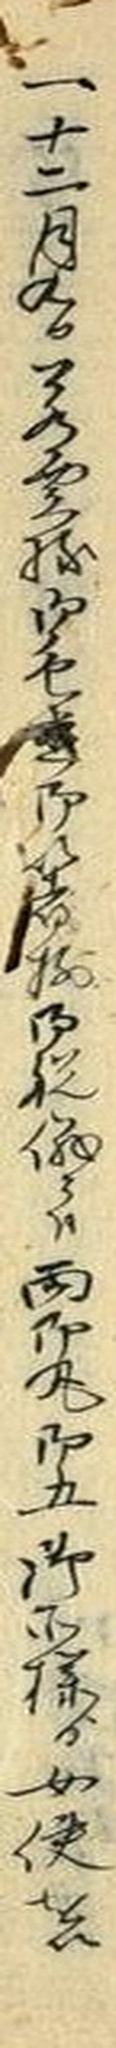一十二月九日若殿様御色直御箸揃御祝儀ニ付両御丸御五御所様ゟ女使を以
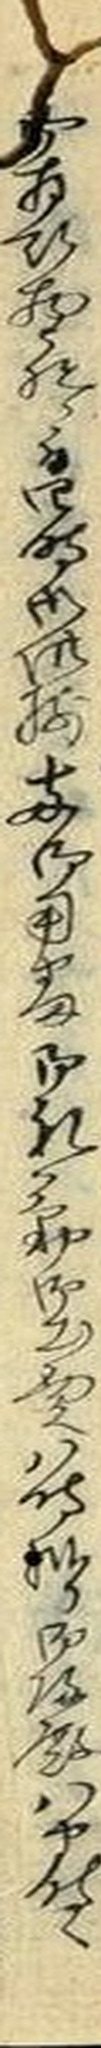御拝領物被遊候ニ付四時御供揃両御用番御礼勤御出殿八時掛り御帰殿八半時へ
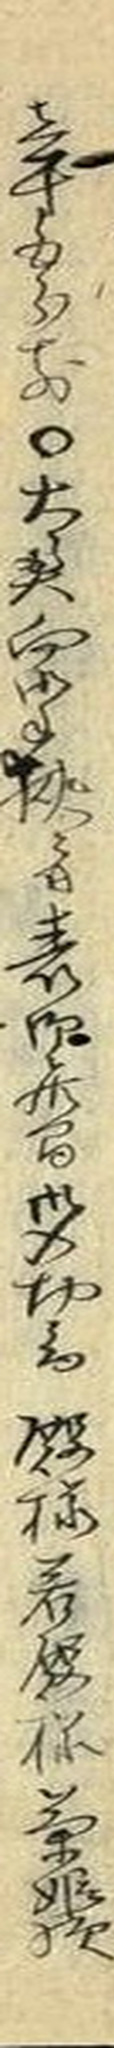壱寸五分前〇大奥向御手狭ニ付表御居間御〆切ニ而殿様若殿様菊姫様
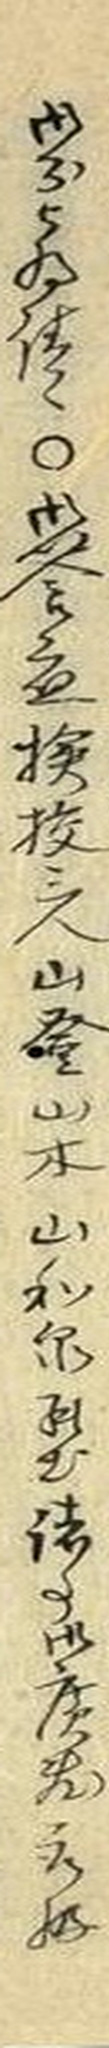御分被為請候〇御饗応検校三人山登山木山和泉罷出諸事御広敷取扱
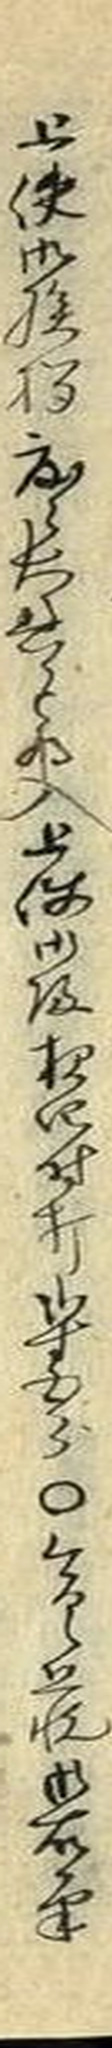上使御挨拶度々大奥被為入上使御帰夜四時打弐寸五分○今日今日恐悦御右筆
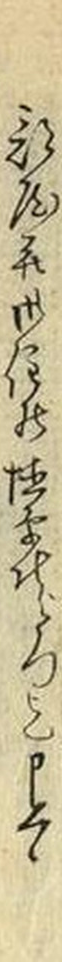部屋并御住居植原次郎右衛門迄申上候
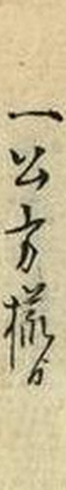一公方様ゟ
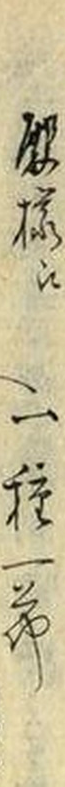若殿様江一種一荷
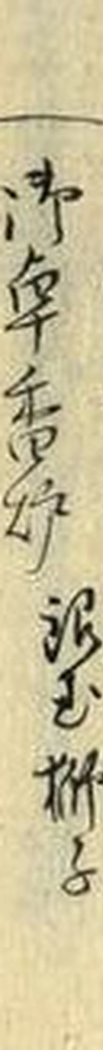御卓香炉銀玉獅子
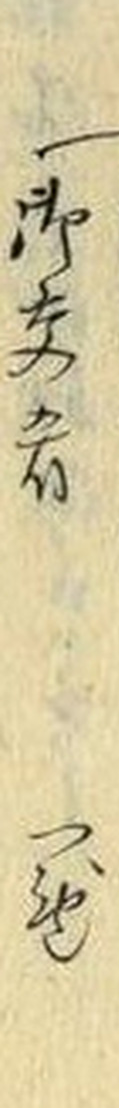御交肴一台
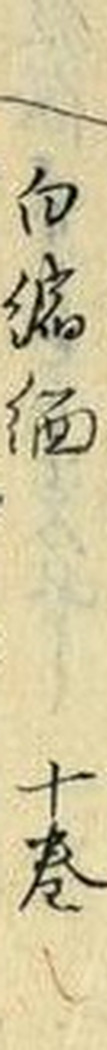白縮緬十巻
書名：少傅日録抄（斉承付側向頭取日記、在府）
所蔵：福井県文書館 Fukui Prefectural Archives
